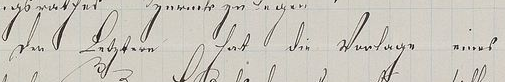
Der Letztere hat die Vorlage eines
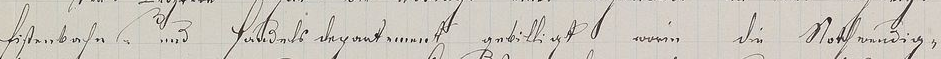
Eisenbahn- und Handelsdepartement gebilligt worin die Nothwendig-
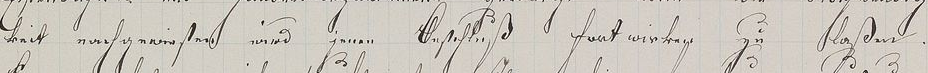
keit nachgewiesen wird jenen Beschluß fortwirken zu laßen.
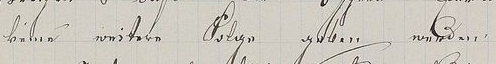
keine weitere Folge geben werden.
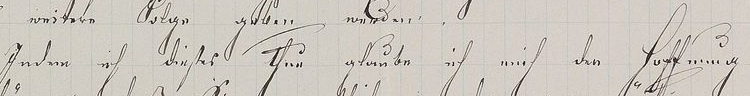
Indem ich dieses thue glaube ich mich der Hoffnung
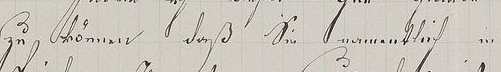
zu können daß Sie namentlich in
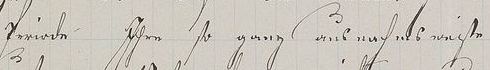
Periode Ihre so ganz ausnahmsweise
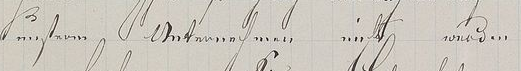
unserm Unternehmen nicht werden
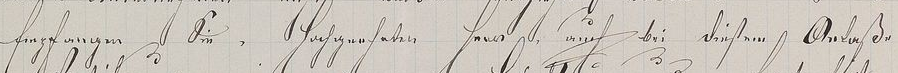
Empfangen Sie, Hochgeehrter Herr, auch bei diesem Anlaße
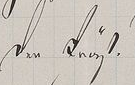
Der Präs.
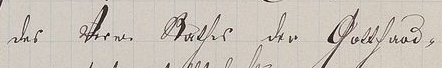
des Verw.Rathes der Gotthard-
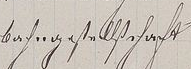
bahngesellschaft
